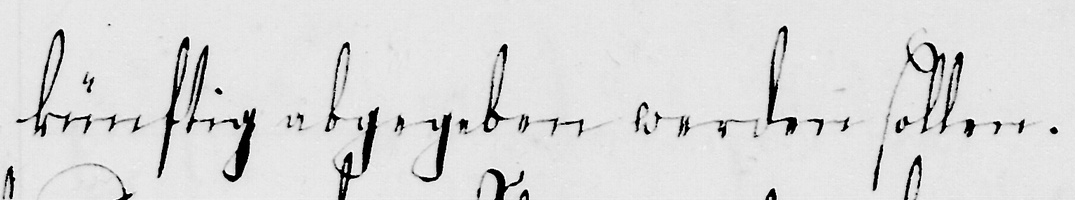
künftig abgegeben werden sollen.
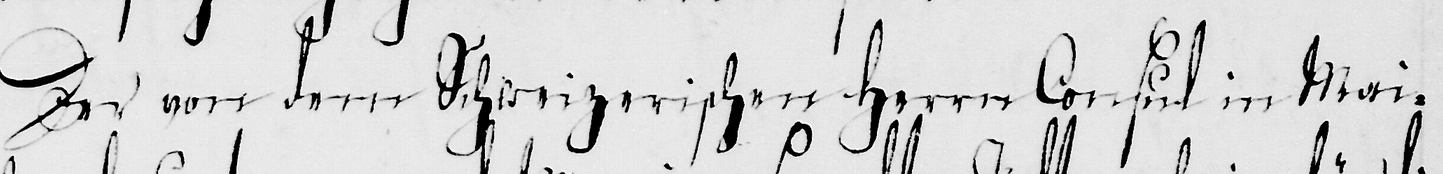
Der von dem Schweizerischen Herrn Consul in Mai¬
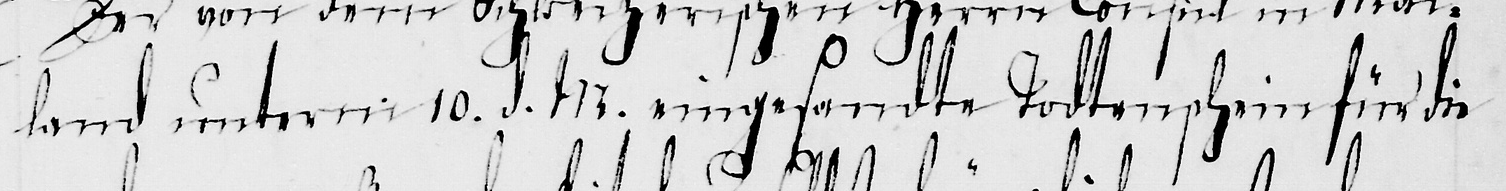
land unterm 10. d. M. eingesandte Todtenschein für die
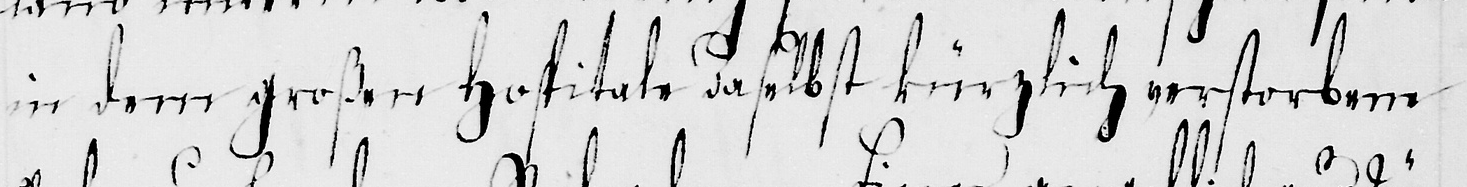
in dem großen Hospitale daselbst kürzlich verstorbene
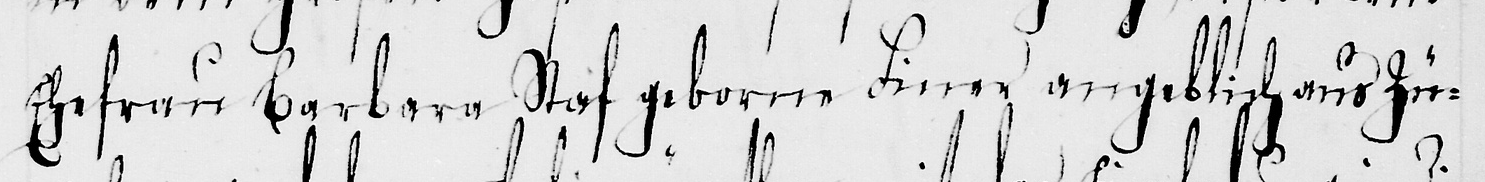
Ehefrau Barbara Staf geborne Finer angeblich aus Zü¬
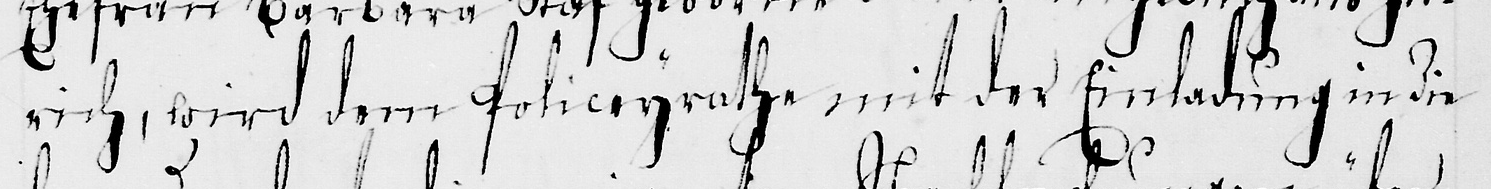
rich, wird dem Policeyrathe mit der Einladung in die
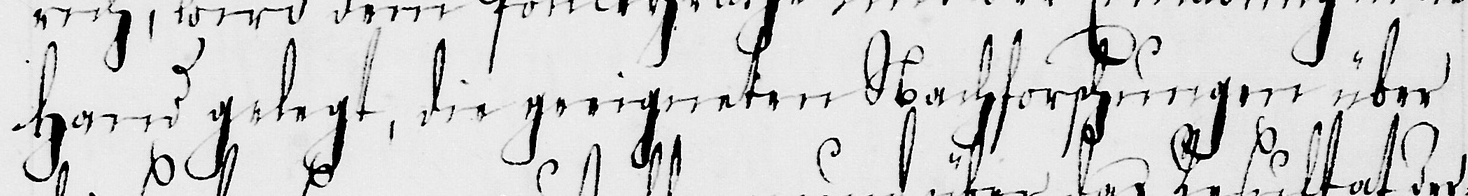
Hand gelegt, die geeigneten Nachforschungen über
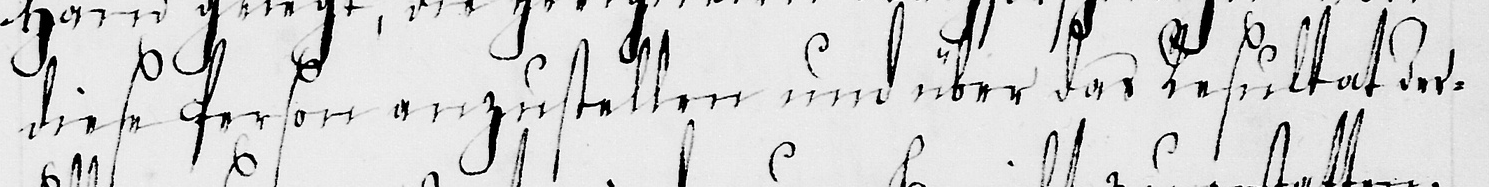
diese Person anzustellen und über das Resultat der¬
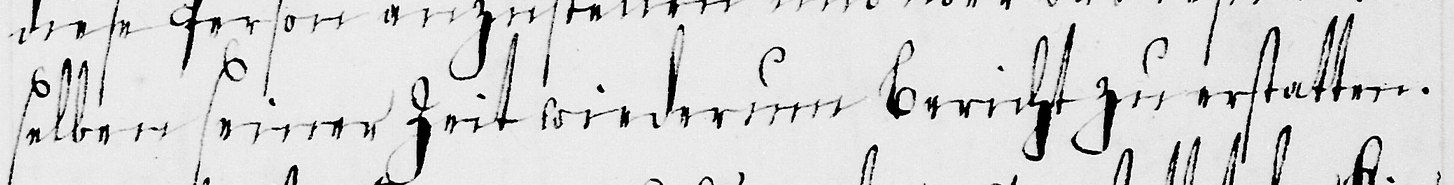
selben seiner Zeit wiederum Bericht zu erstatten.
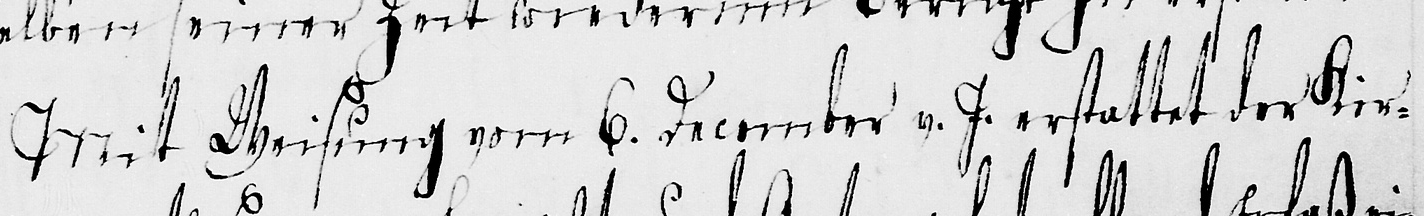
Mit Weisung vom 6. December v. J. erstattet der Kir¬
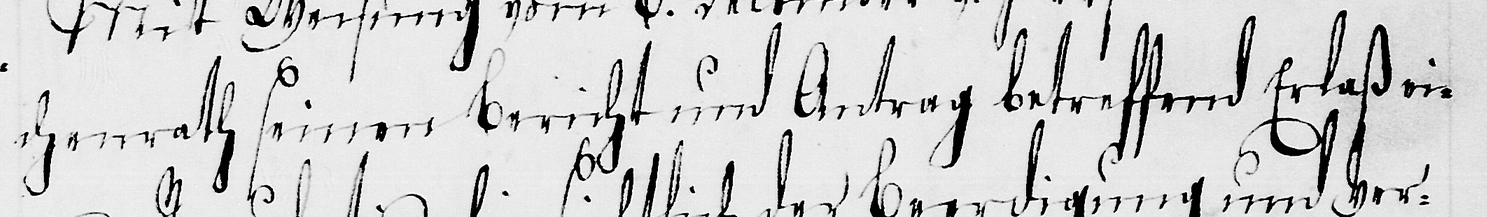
chenrath seinen Bericht und Antrag betreffend Erlaß ei¬
